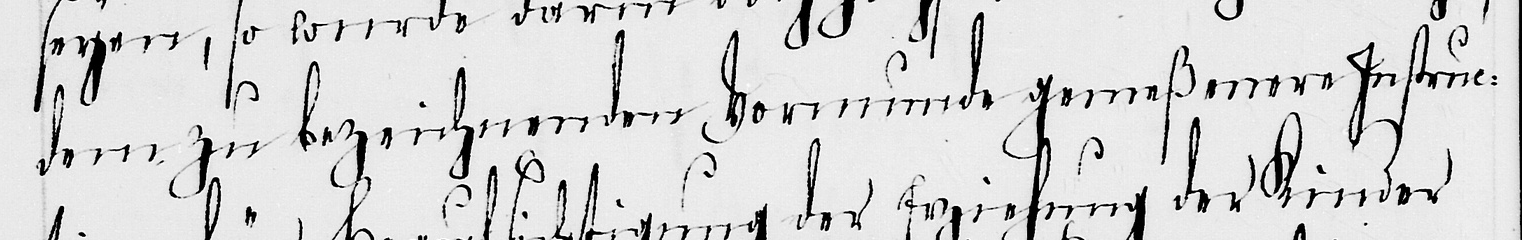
dem zu bezeichnenden Vormunde gemeßenere Instruc¬
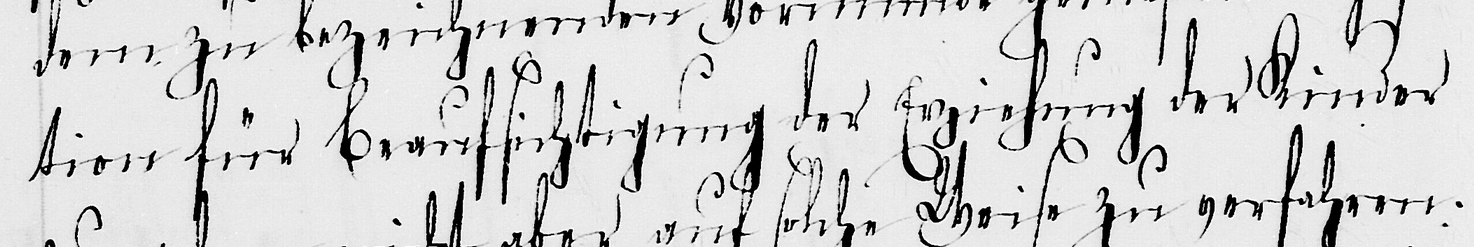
tion für Beaufsichtigung der Erziehung der Kinder
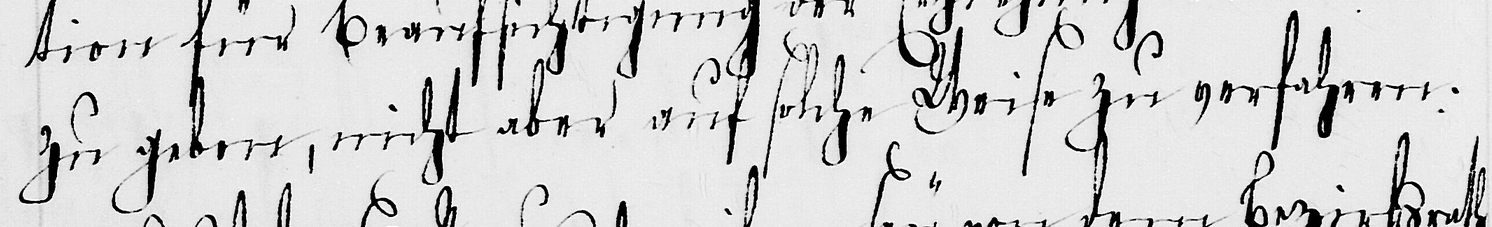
zu geben, nicht aber auf solche Weise zu verfahren.
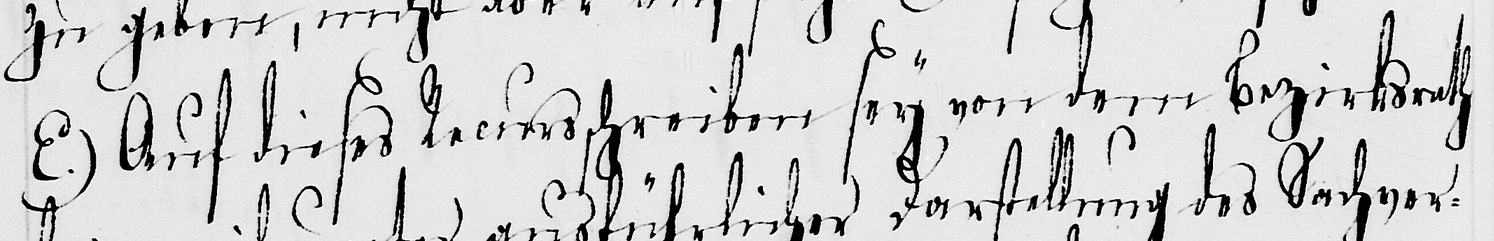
E.) Auf dieses Recursschreiben sey von dem Bezirksrath
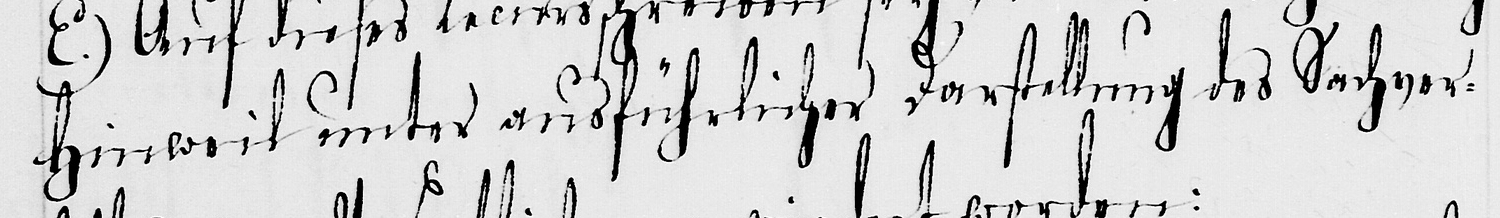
Hinweil unter ausführlicher Darstellung des Sachver¬
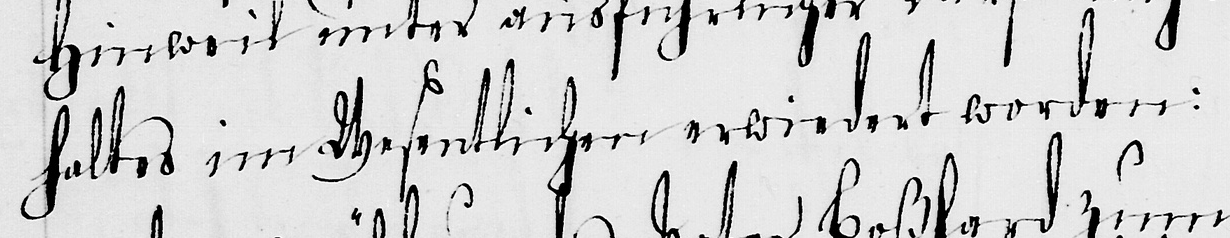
haltes im Wesentlichen erwiedert worden:
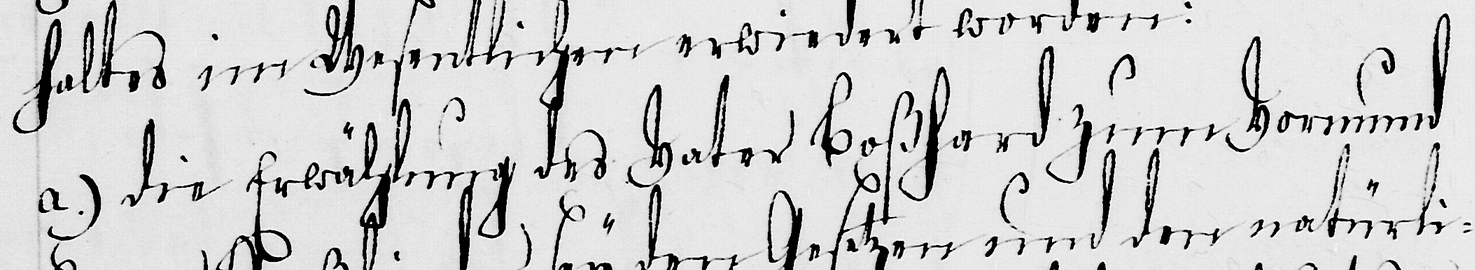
a.) Die Erwählung des Vater Boßhard zum Vormund
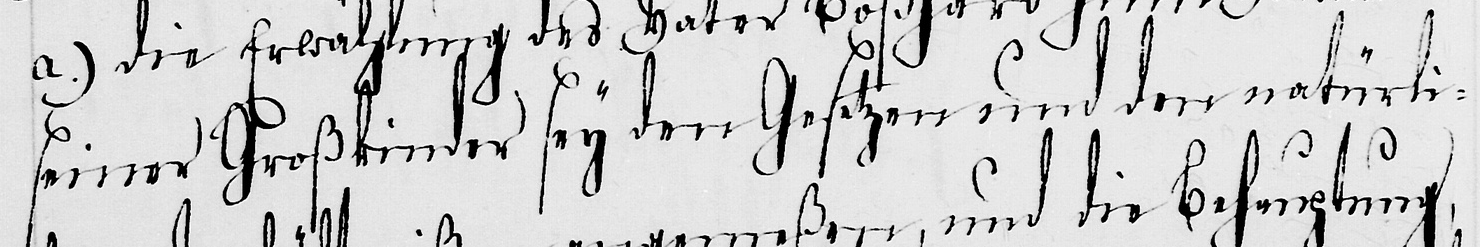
seiner Großkinder sey den Gesetzen und den natürli¬
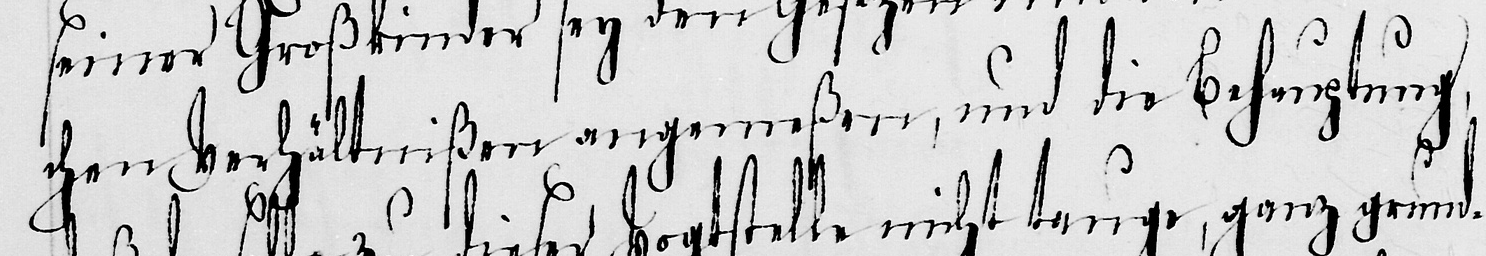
chen Verhältnißen angemeßen, und die Behauptung,
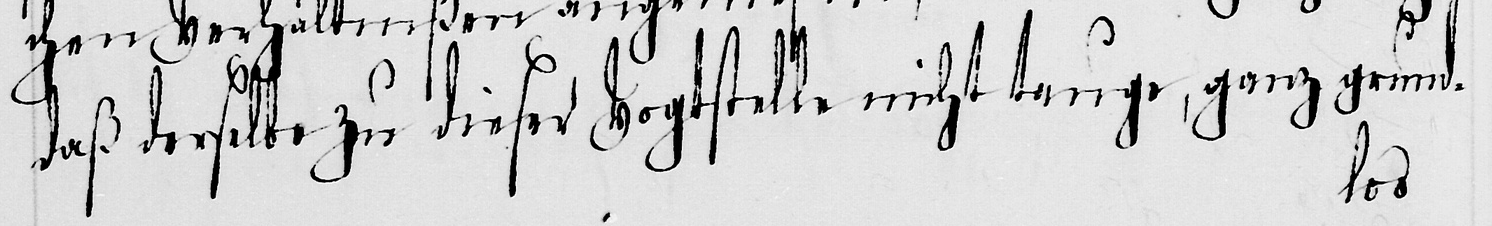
daß derselbe zu dieser Vogtstelle nicht tauge, ganz grund-
